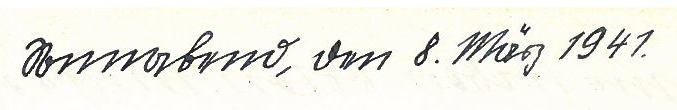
Sonnabend, den 8. März 1941.
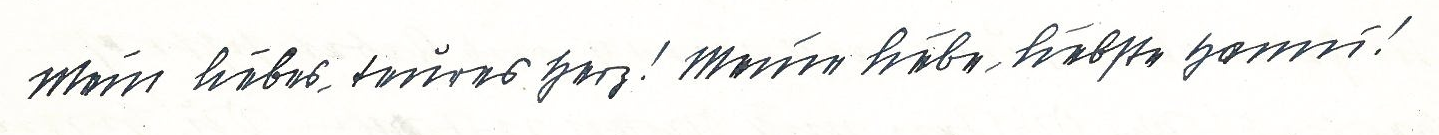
Mein liebes, teures Herz! Meine liebe, liebste Hilde!
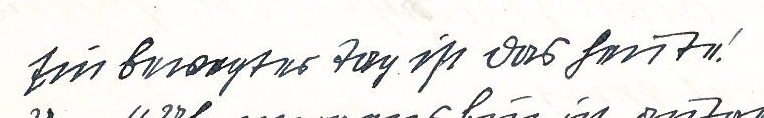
Ein bewegter Tag ist das heute!
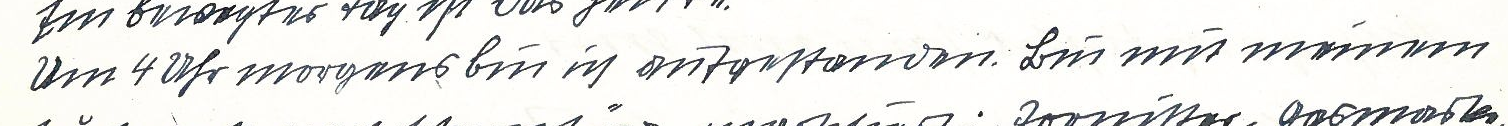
Um 4 Uhr morgens bin ich aufgestanden: Bin mit meinem
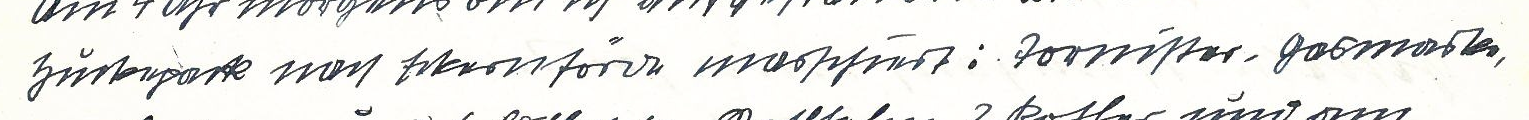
Huckepack nach Eckernförde marschiert: Tornister, Gasmaske,
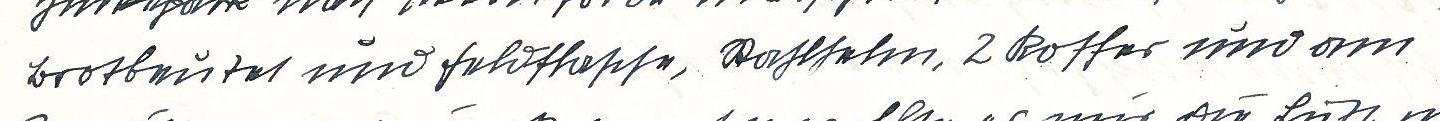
Brotbeutel und Feldflasche, Stahlhelm, 2 Koffer und am
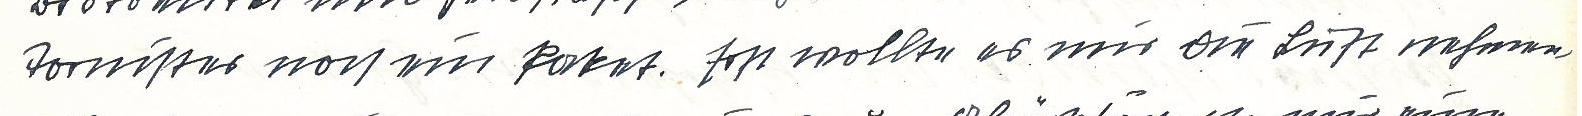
Tornister noch ein Paket. Erst wollte es mir die Luft nehmen,
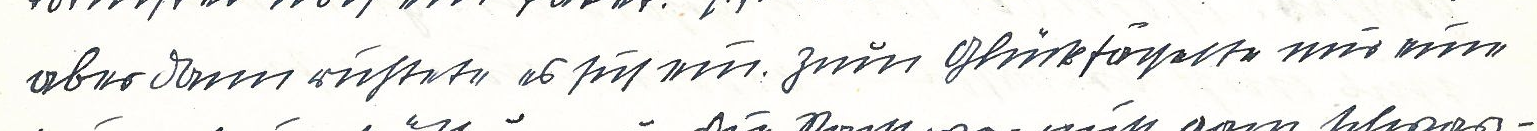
aber dann richtete es sich ein. Zum Glück fächelte mir eine
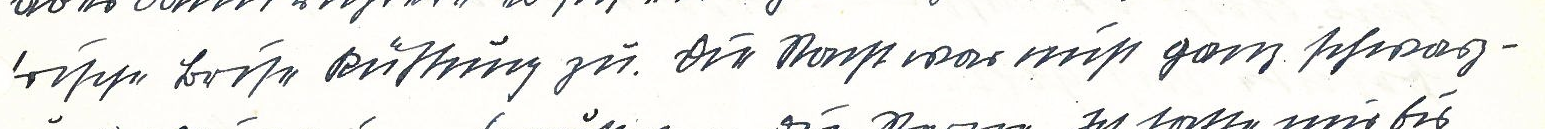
rische Brise Kühlung zu. Die Nacht war nicht ganz schwarz –
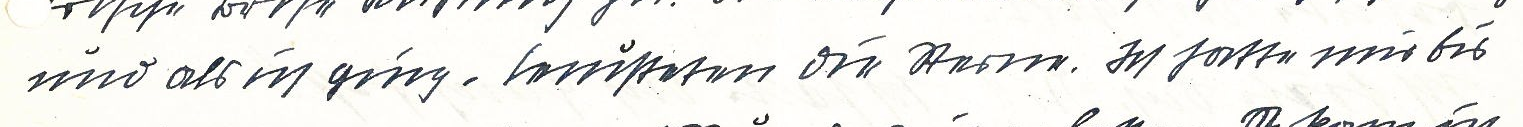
und als ich ging, leuchteten die Sterne. Ich hatte mir bis
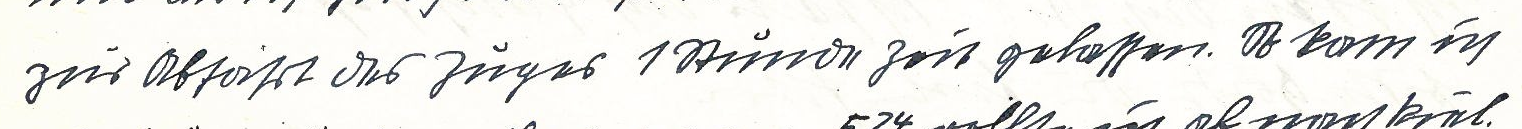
zur Abfahrt des Zuges 1 Stunde Zeit gelassen. So kam ich
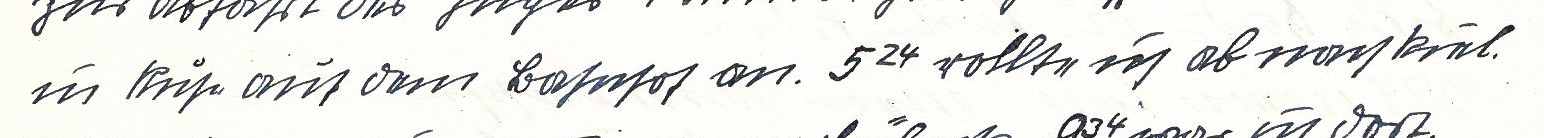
in Ruhe auf dem Bahnhof an. 524 rollte ich ab nach Kiel.
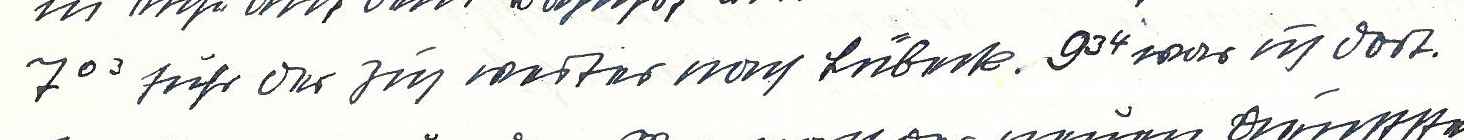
703 fuhr der Zug weiter nach Lübeck. 934 war ich dort.
